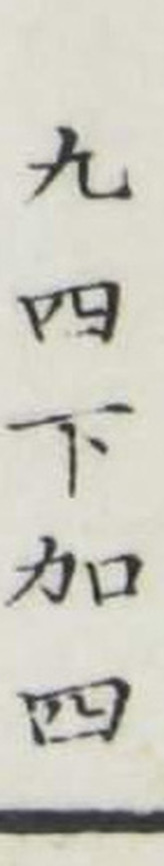九四下加四
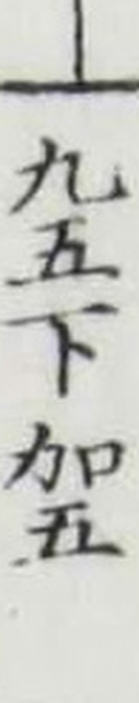九五下加五
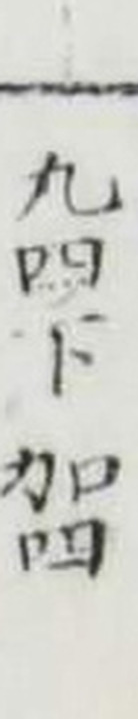九四下加四
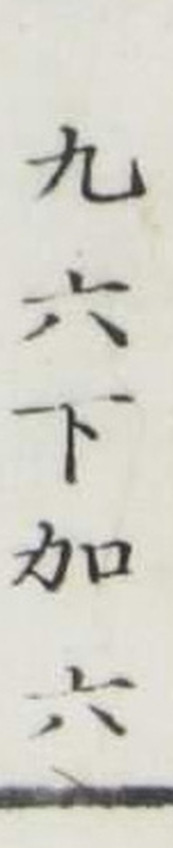九六下加六
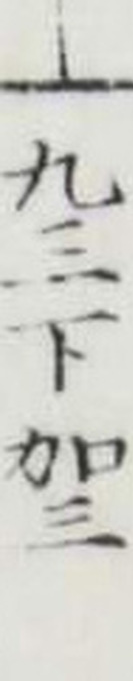九三下加三
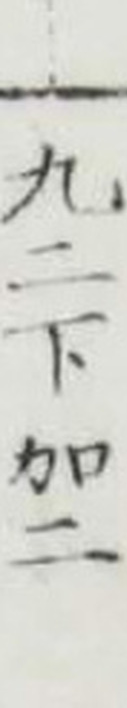九二下加二
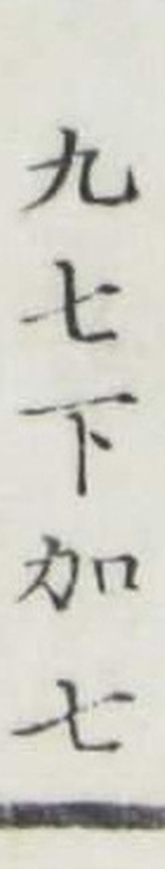九七下加七
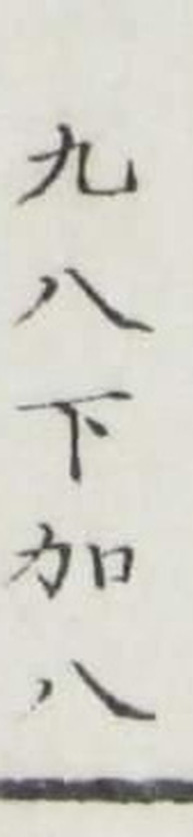九八下加八
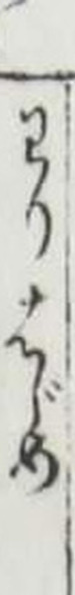わりはじめ
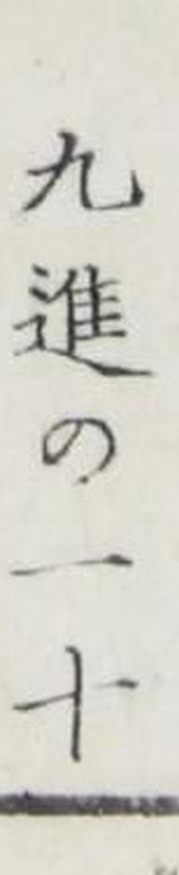九進の一十
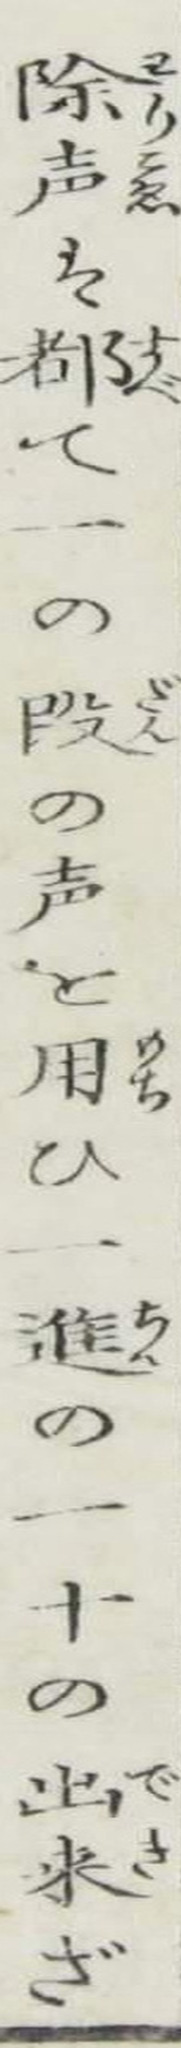顕一除声は都て一の段の声を用ひ一進の一十の出来ざ
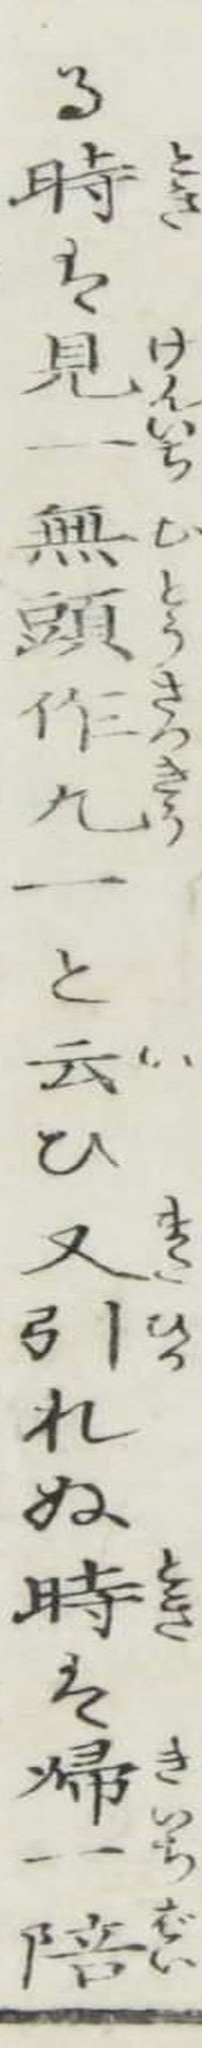る時は見一無頭作九一と云ひ又引れぬ時は帰一賠
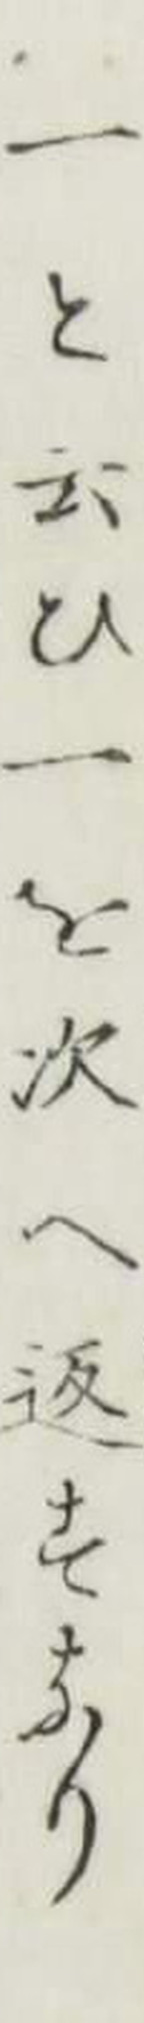一と云ひ一を次へ返すなり
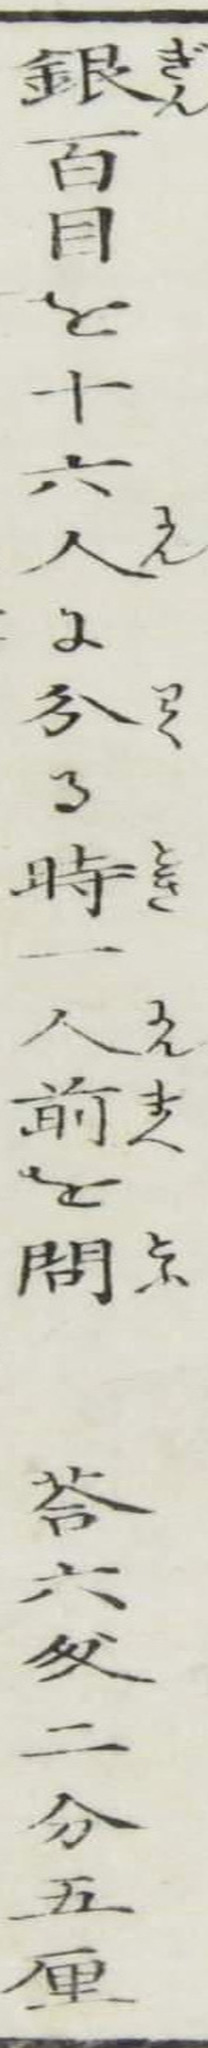銀百目を十六人に分る時一人前を問答六匁二分五厘
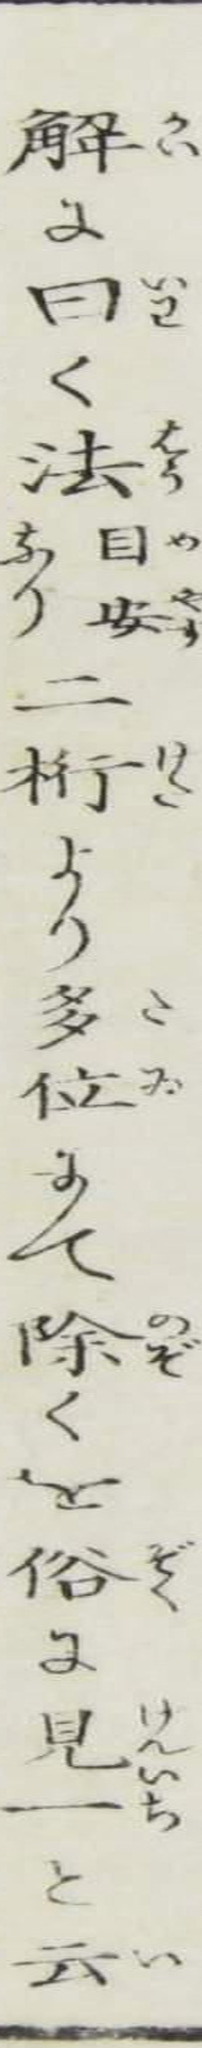解に曰く法目安なり二桁より多位にて除くを俗に見一と云
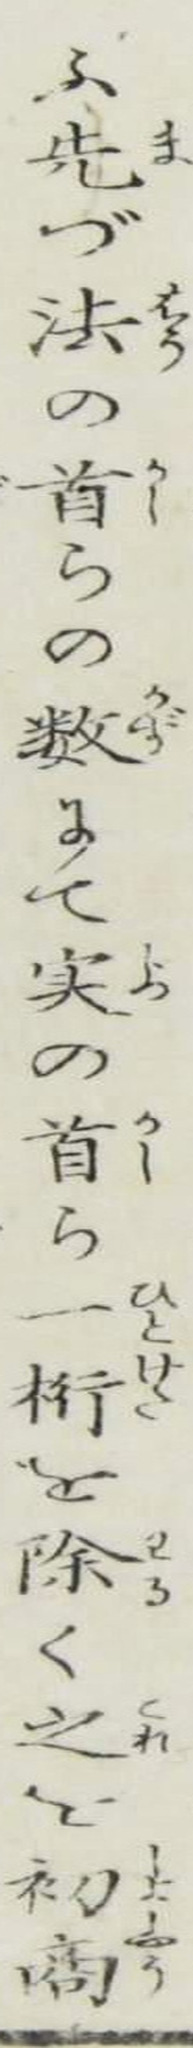ふ先づ法の首らの数にて実の首ら一桁を除く之を初商
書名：明治小學塵劫記 卷1
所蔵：東京学芸大学教育コンテンツアーカイブ
